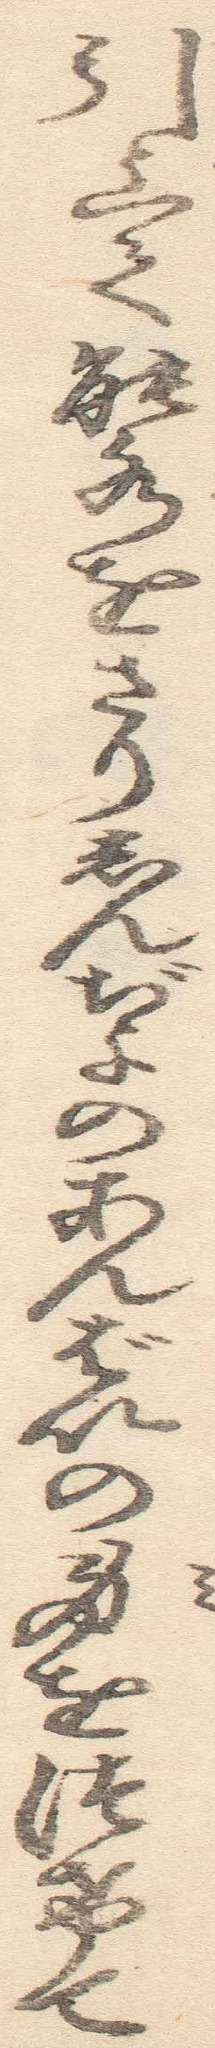引上て能水をさりしんじよのあんばいの身をつけて
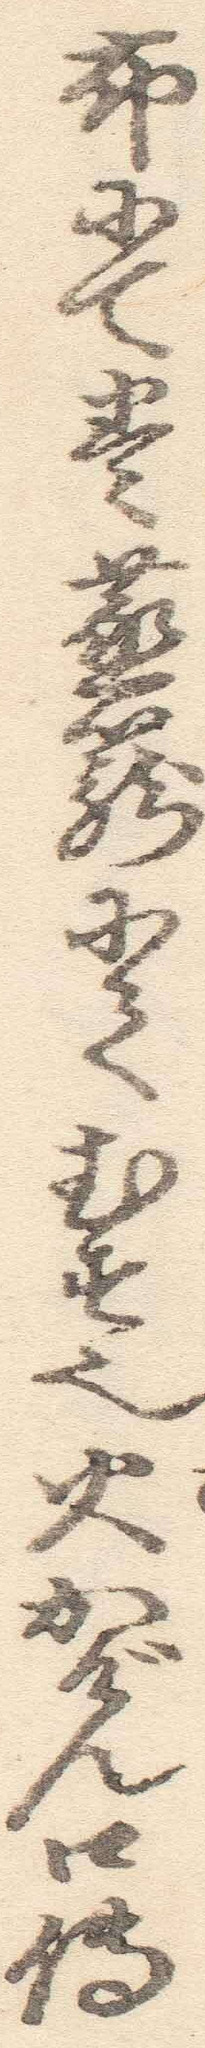布にて巻蒸籠にてむす也火かげん口伝
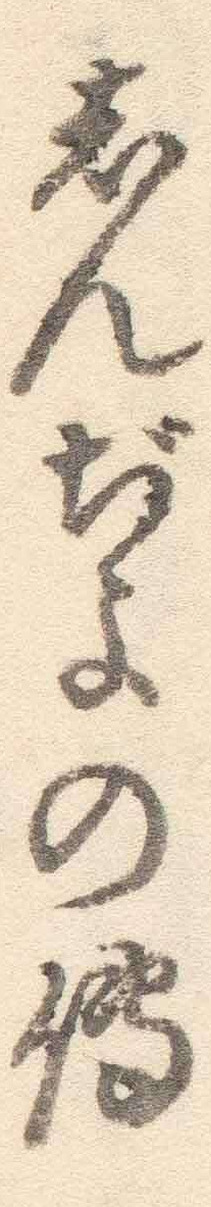しんじよの伝
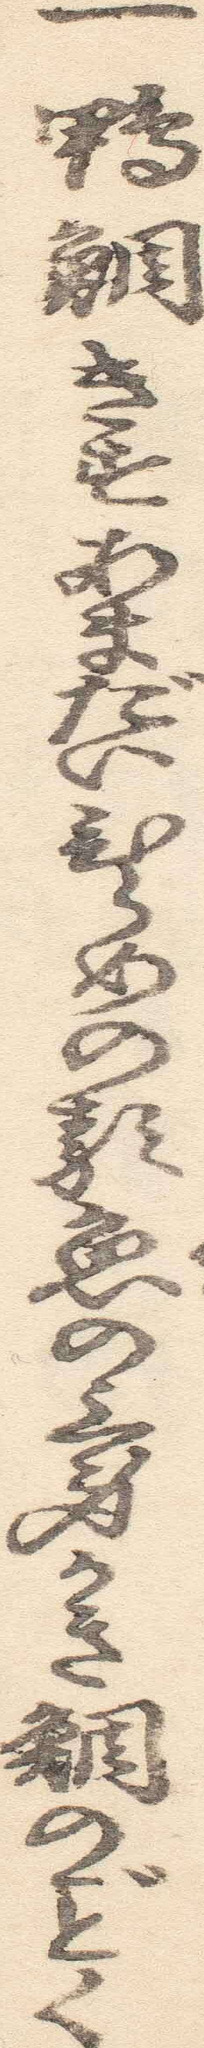一鴨鯛きすあまだいひらめの類魚の上身かき鯛のごとく
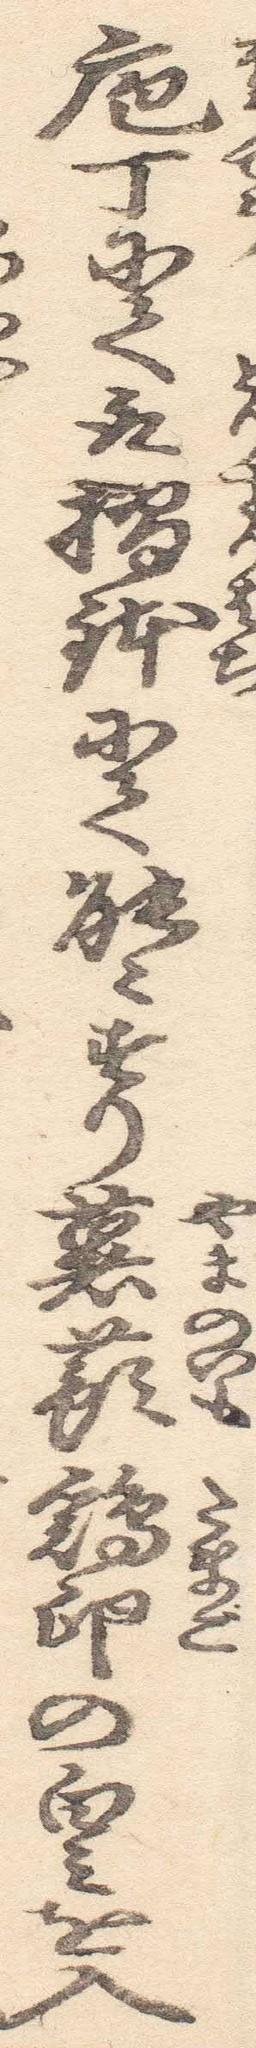包丁にて取摺鉢にて能々すり薯蕷鶏卵の白みを入
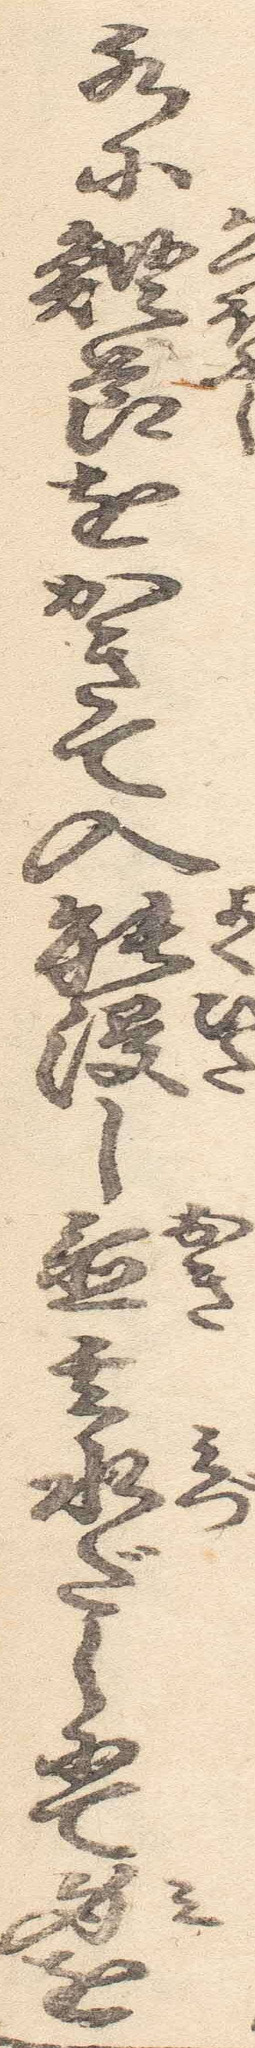水に鰹節をかきて入能浸し置其水だしにて身を
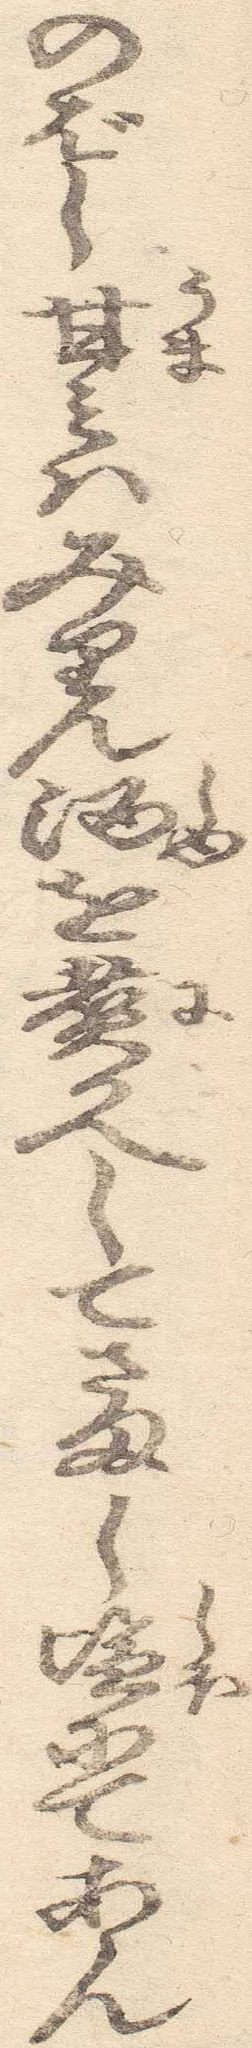のばし甘みはみりん酒を煮かへしてさまし塩にてあん
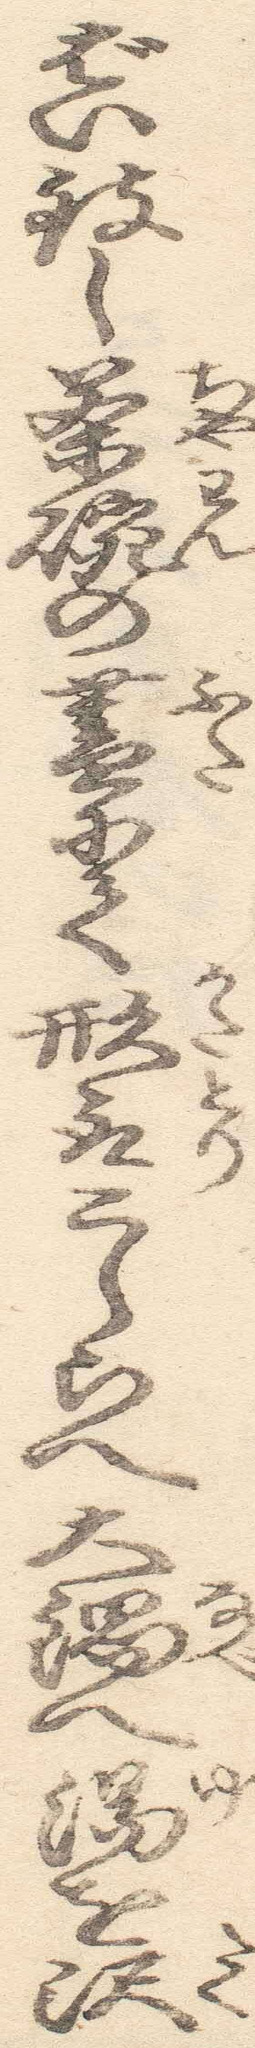ばい致し茶碗の蓋にて形取こしらへ大鍋へ湯を沢
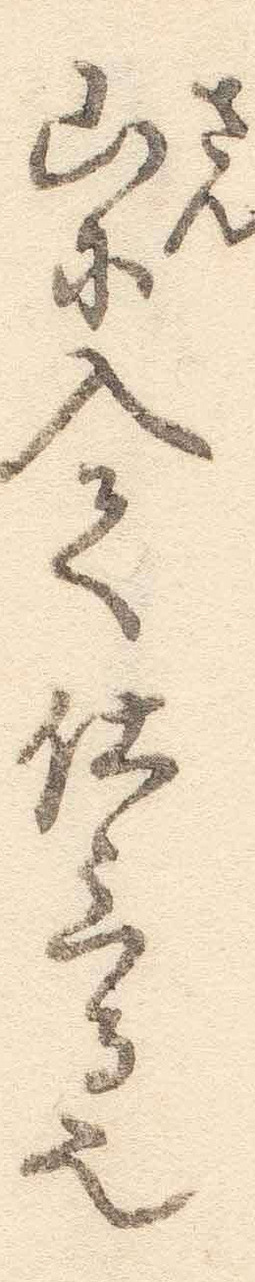山に入て仕上る也
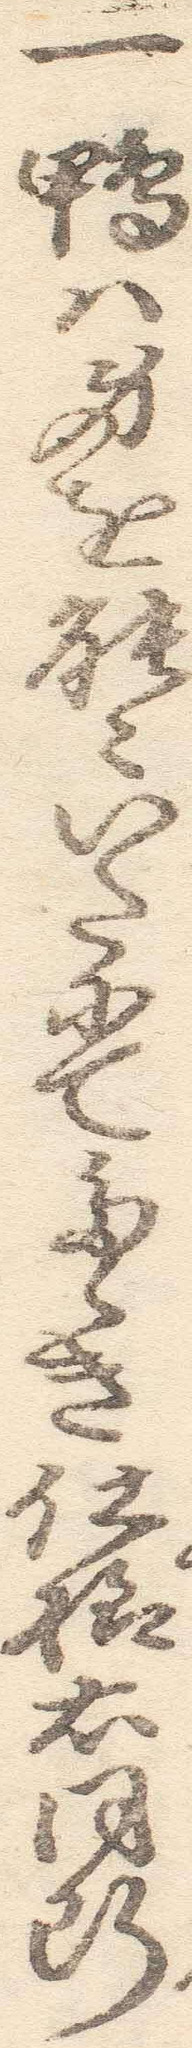一鴨は身を能々いたにてたゝき仕様右同断
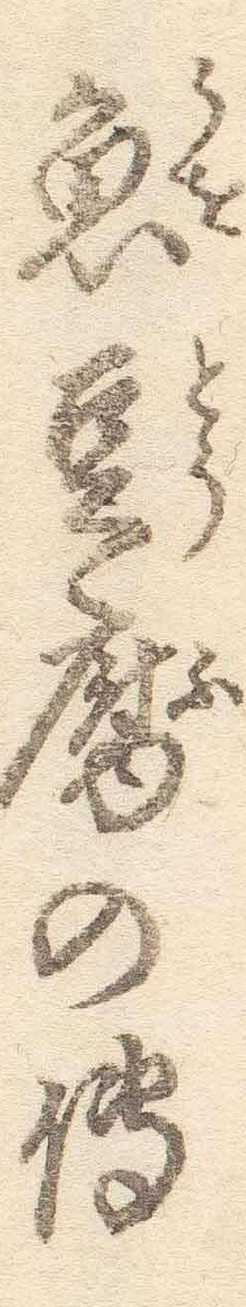魚豆腐の伝
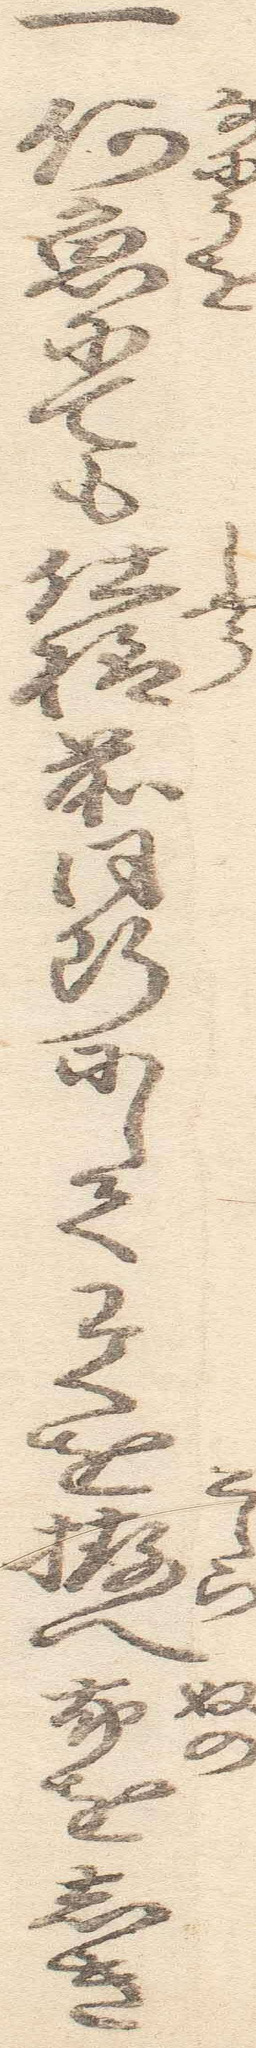一何魚にても仕様前同断にしてわくを拵へ布をしき
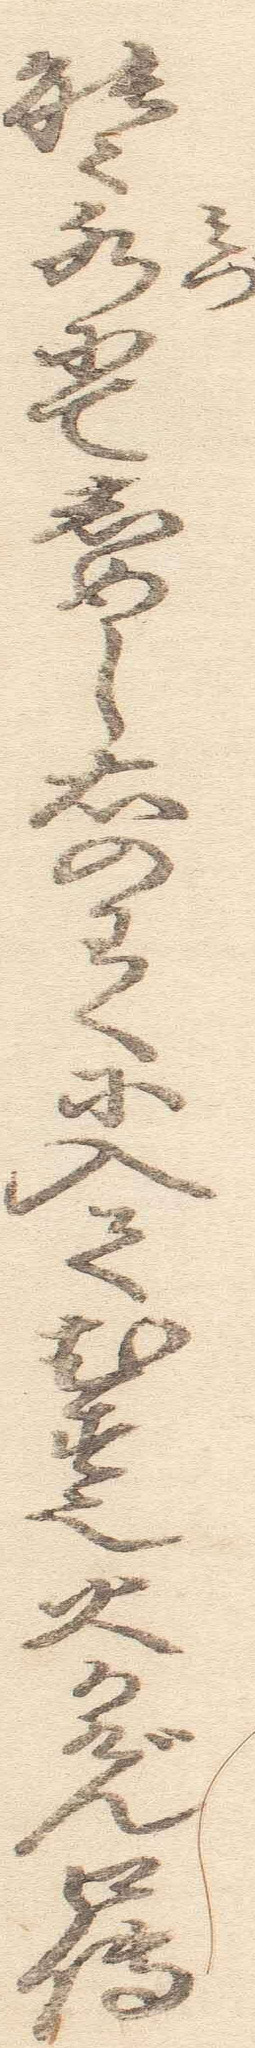能々水にてしめし右のわくに入てむす也火かげん口伝
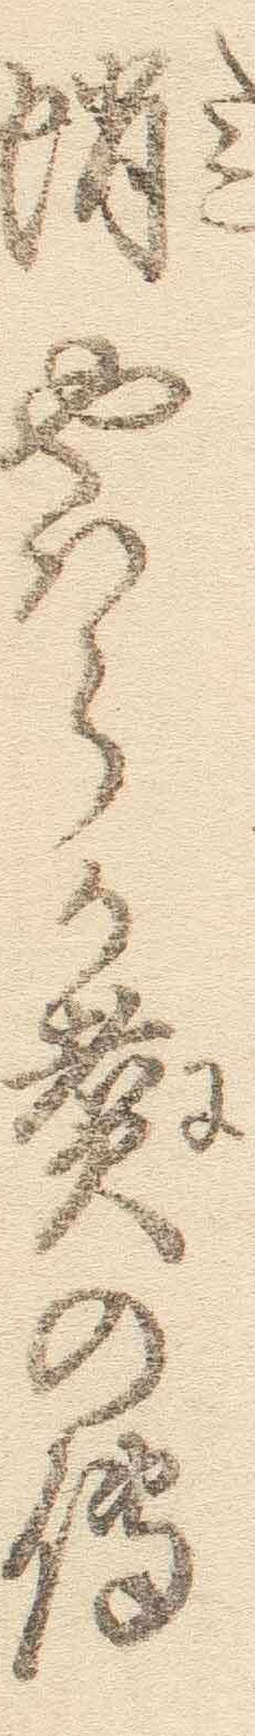蛸やはらか煮の伝
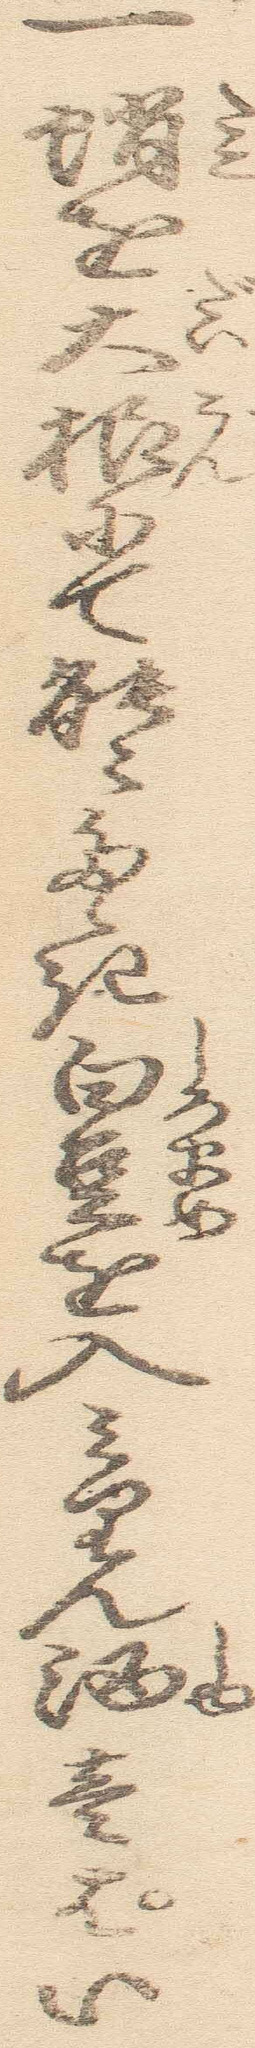一蛸を大根にて能々たゝき白豆を入みりん酒壱ぱい

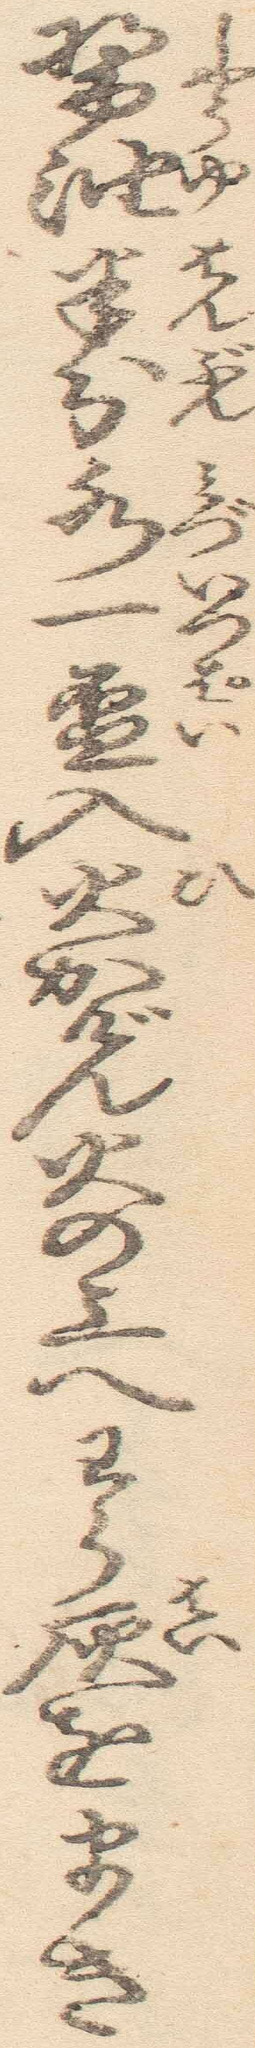醤油半分水一盃入火かげん火の上へわら灰をまき
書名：料理通
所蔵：東京学芸大学附属図書館 国文学研究資料館
